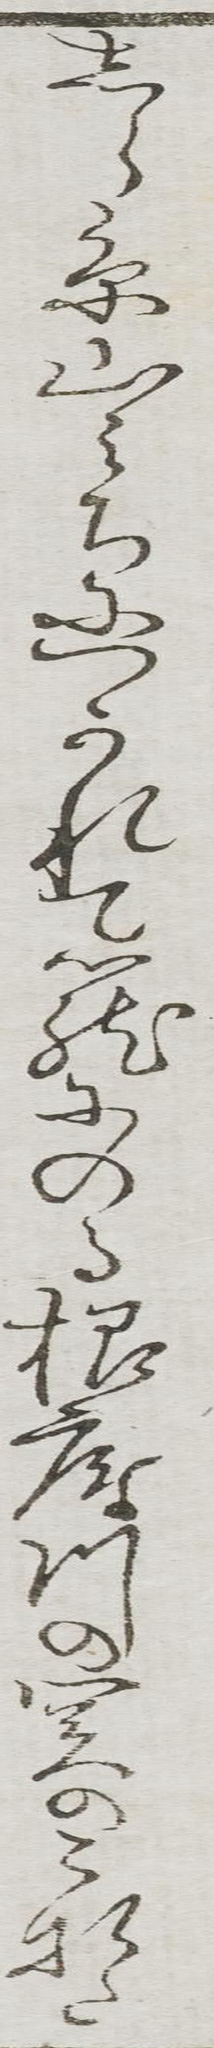しら糸山みちにつかれて籠にのる根府川の関のこなた
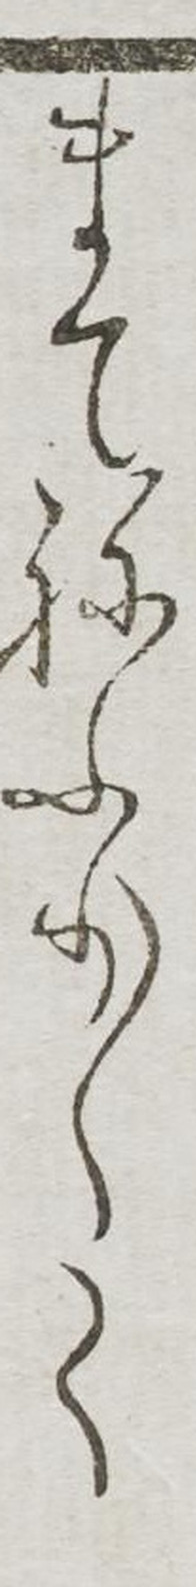まてねふり〳〵て
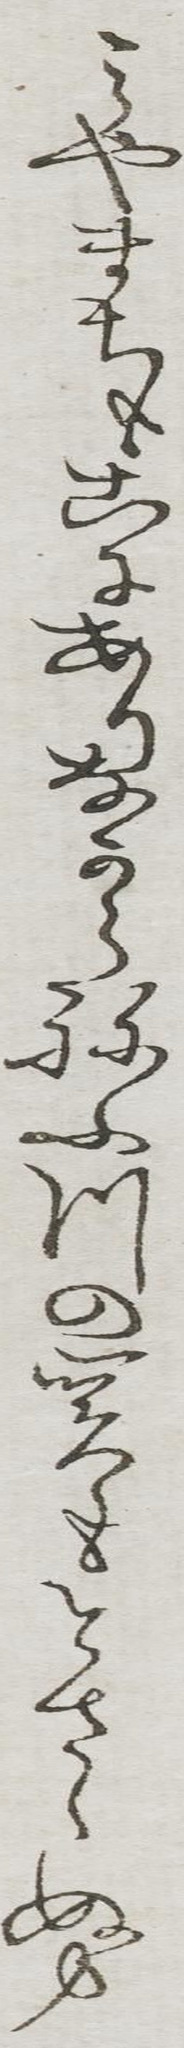みやまちもこにありなからねふ川の関もとさしぬ

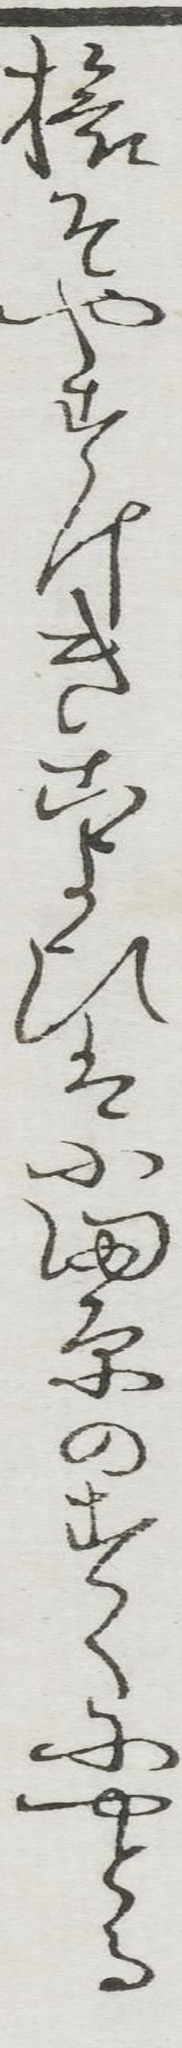旅そやすけきこよひは小田原のすくにやとる
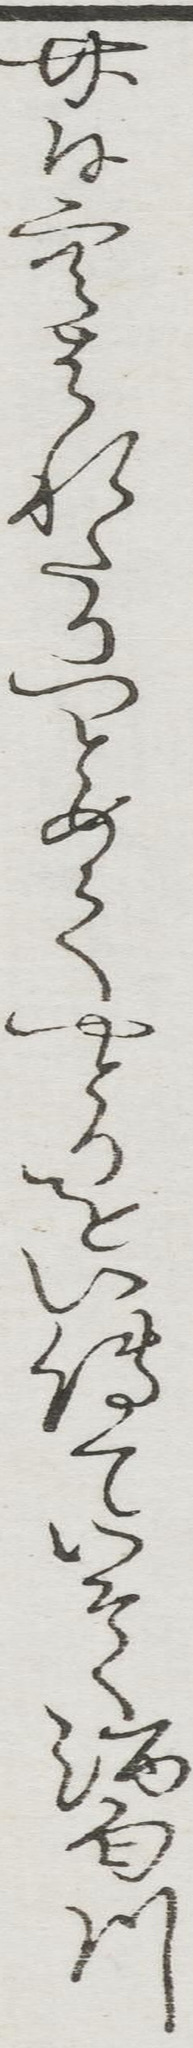廿日空はれたりつとめてやとりをいてていそく酒匂川
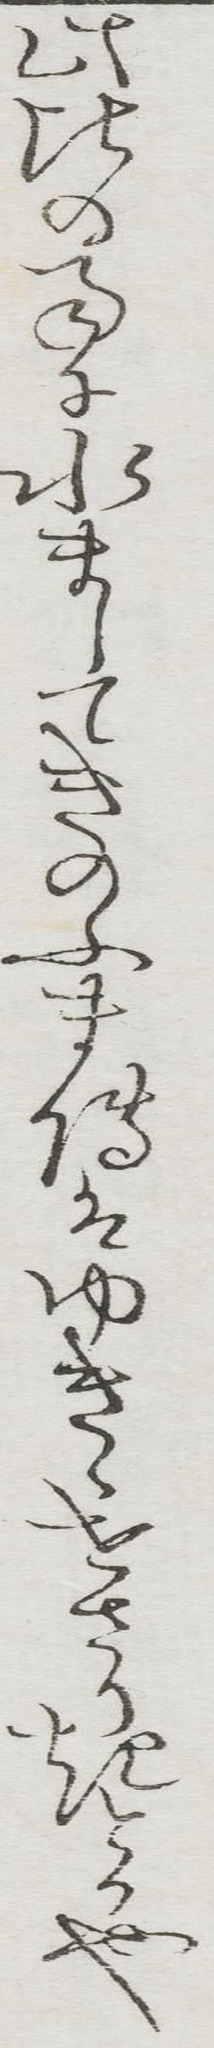此頃の雨に水ましてきのふまてそゆきゝせさりきとかや
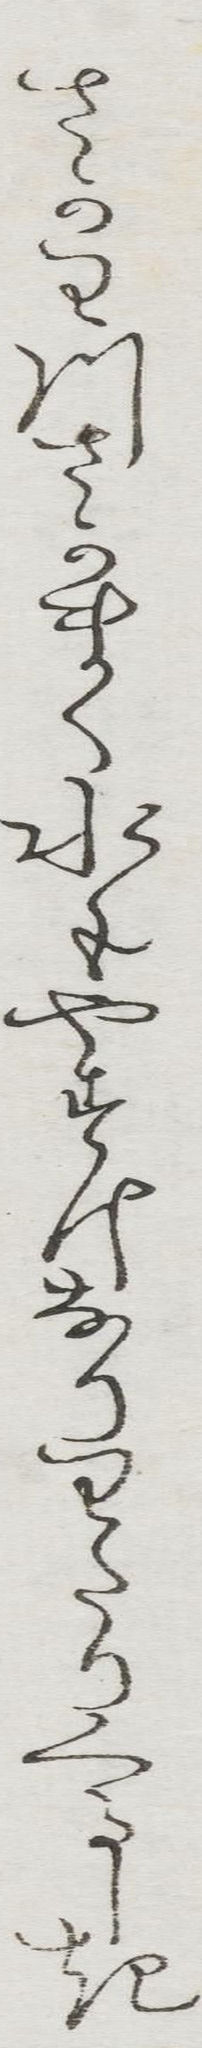さかわ川さかまく水もやすけなりわたりくるしき
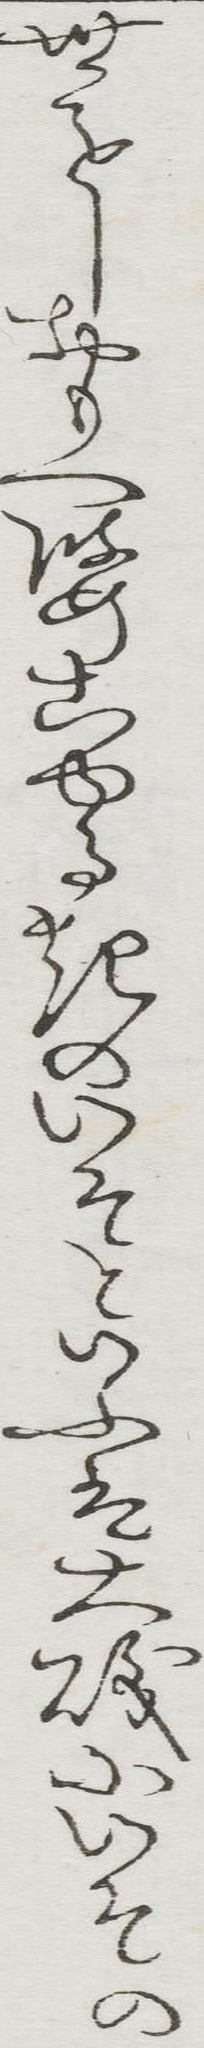世をしおもへはこゆるきのいそといふは大磯小いその
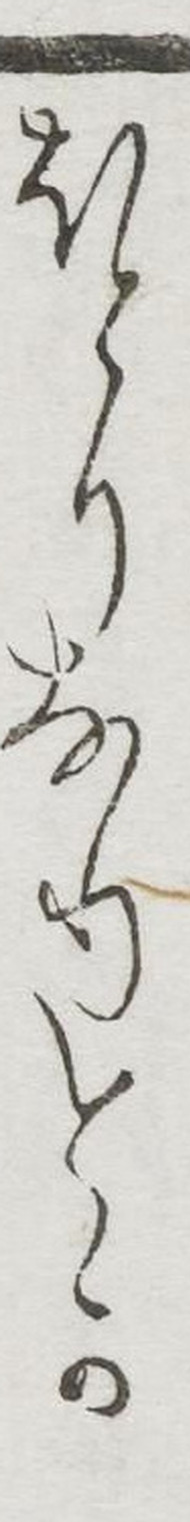ほとりなりとか
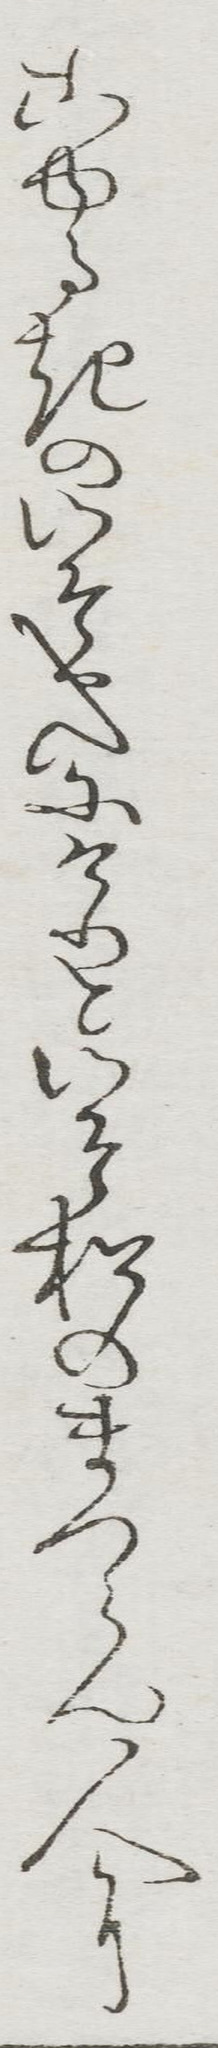こゆるきのいそきにけりといそ松のまつらん人に
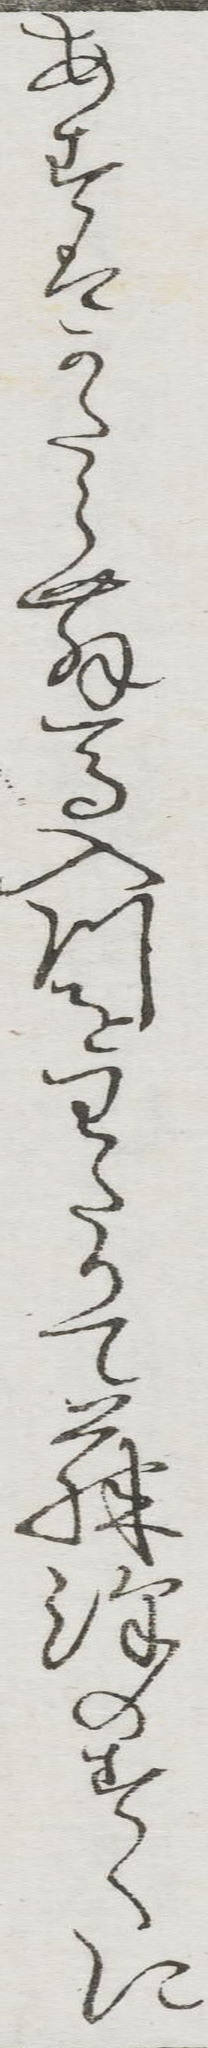あすはかたらむ馬入川をわたりて藤沢のすくに
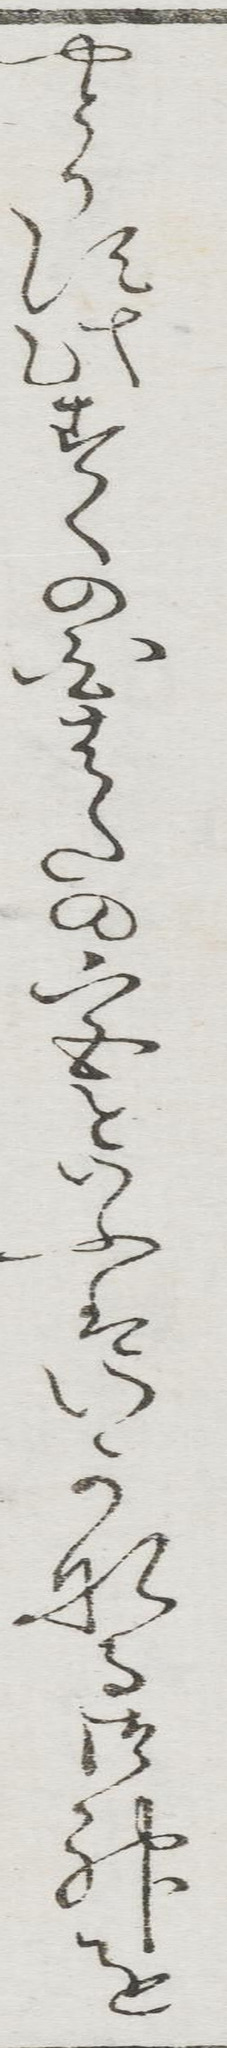やとりす此すくの白はたの宮といふはいかなる御神を
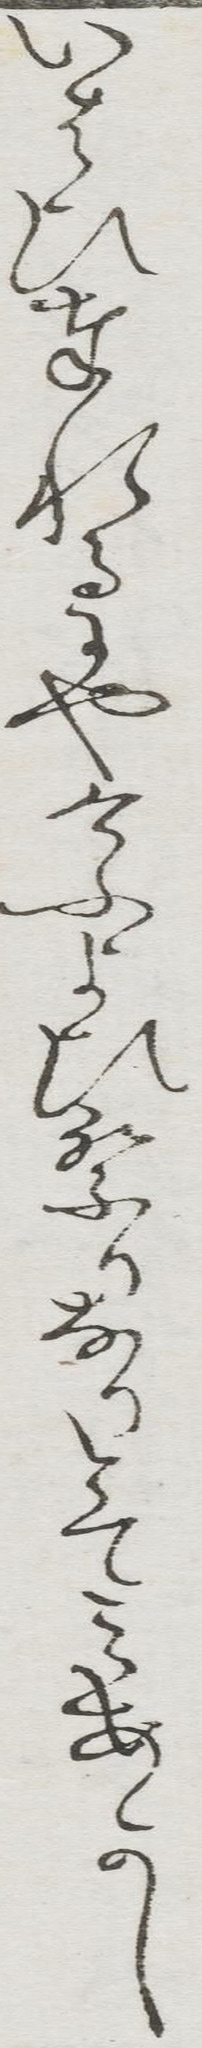いはひ奉れるにやけふよひ祭りなりとてみあかし
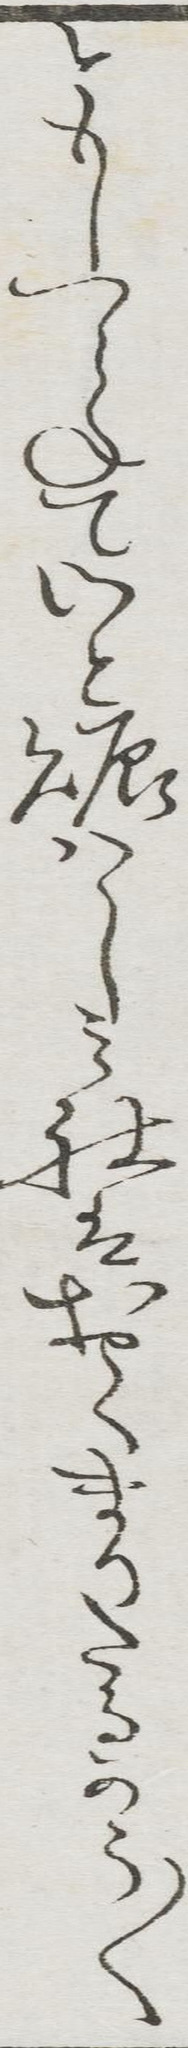ともしつらねていと賑はしみ社はおくまりたるかう〳〵
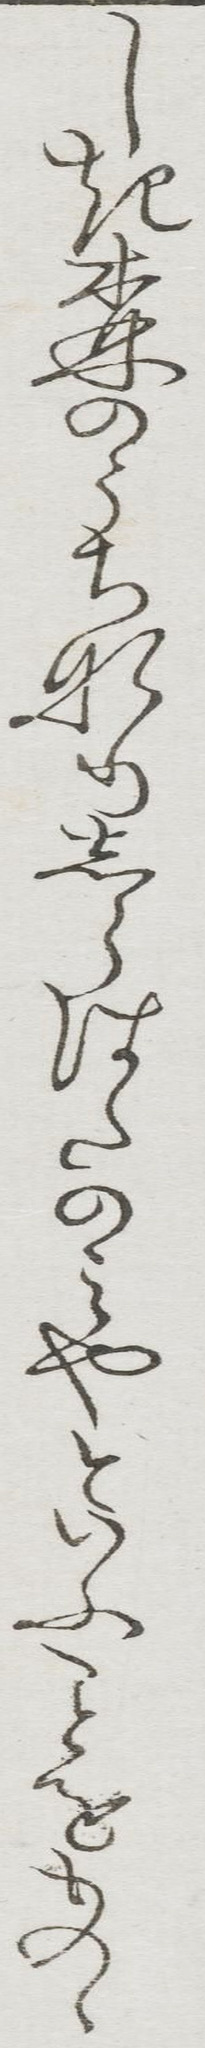しき森のうちなりしらはたのみやといふことをものゝ
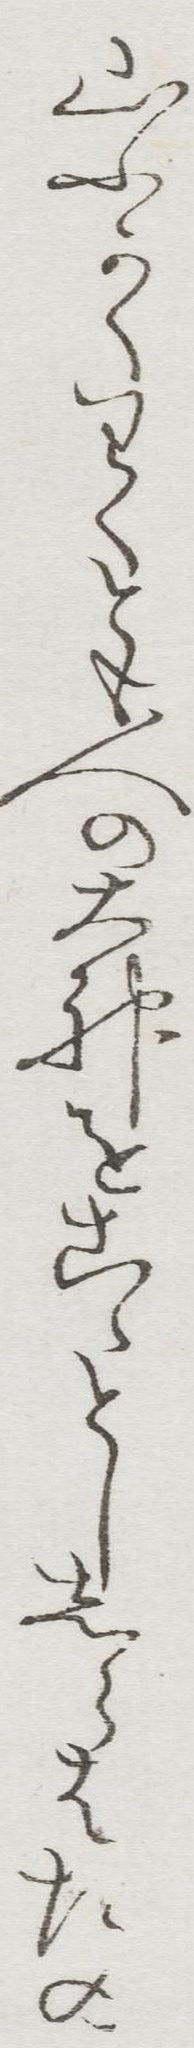山ふかくわくとも人の大神をこゝとししらはたの
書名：挿画熱海日記　全
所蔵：東京大学地震研究所図書室 Earthquake Research Institute Library, The University of Tokyo, JAPAN
